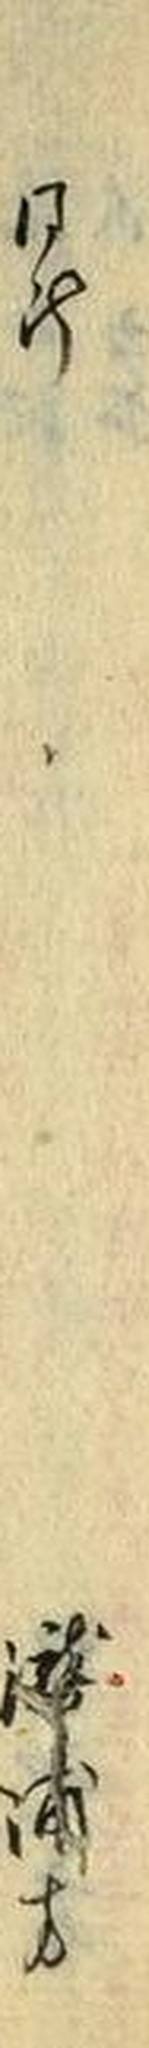同断瀧浦方
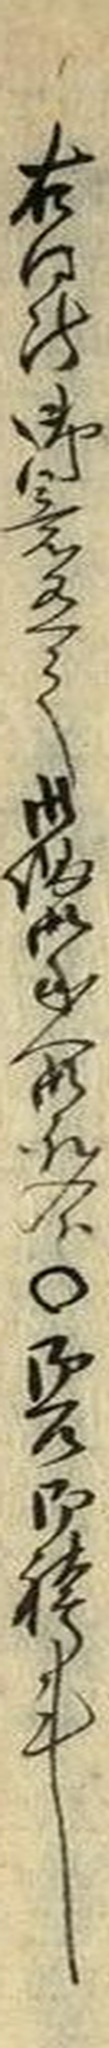右同断御意有之御側御用人御取合○御召御袴斗
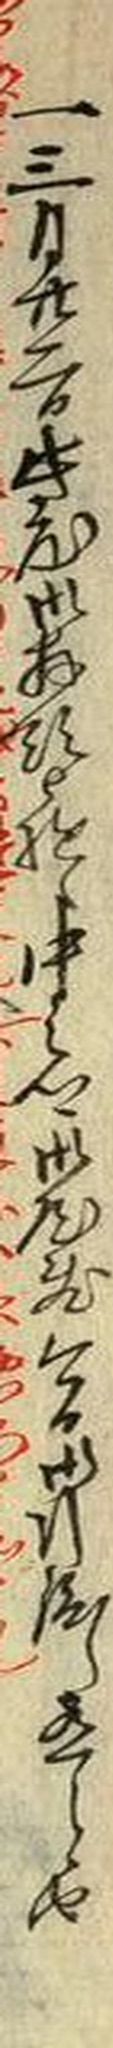一三月廿二日此度御拝領被遊候中之郷御屋敷今日御引渡し有之候由
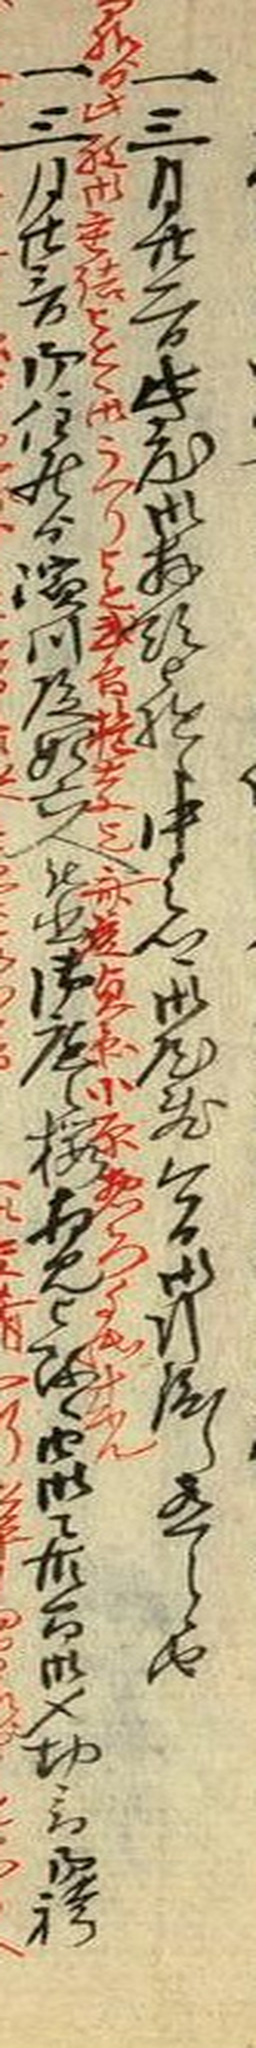一三月廿三日御住居ゟ浜川殿始六人被出御庭之桜拝見被致候由御居間御〆切ニ而御袴
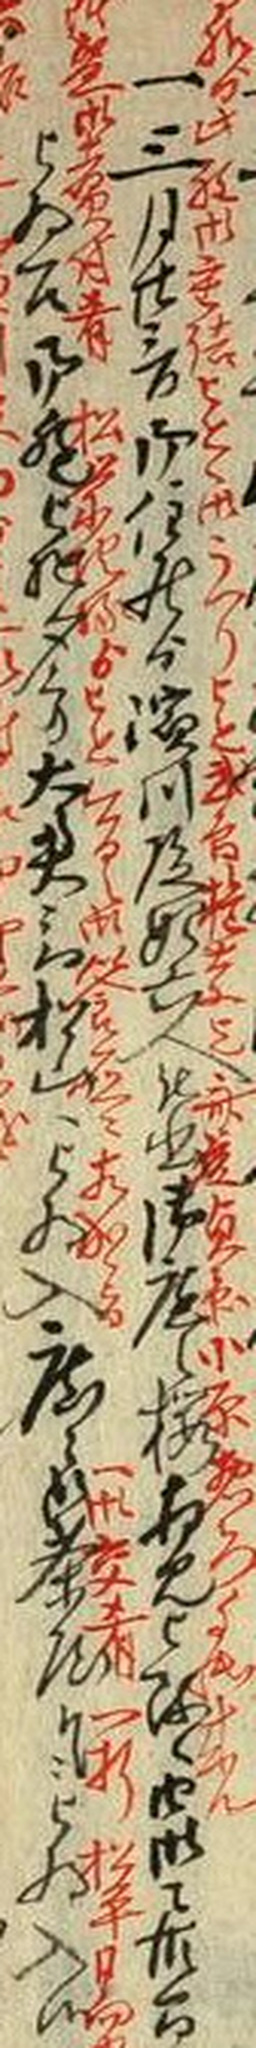被為召御逢被遊夕方大奥ニ而松山へ被為入庭之御茶屋江も被為入候
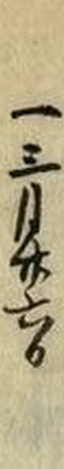一三月廿六日
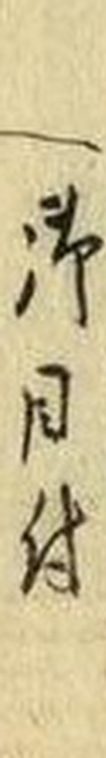御目付
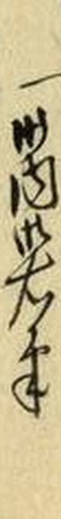御内御右筆
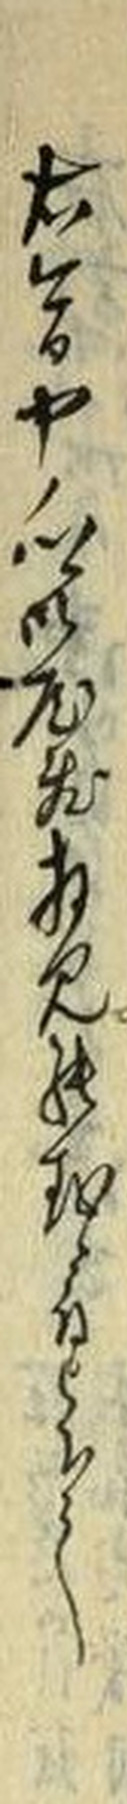右今日中ノ郷御屋敷拝見罷越候ニ付被下之
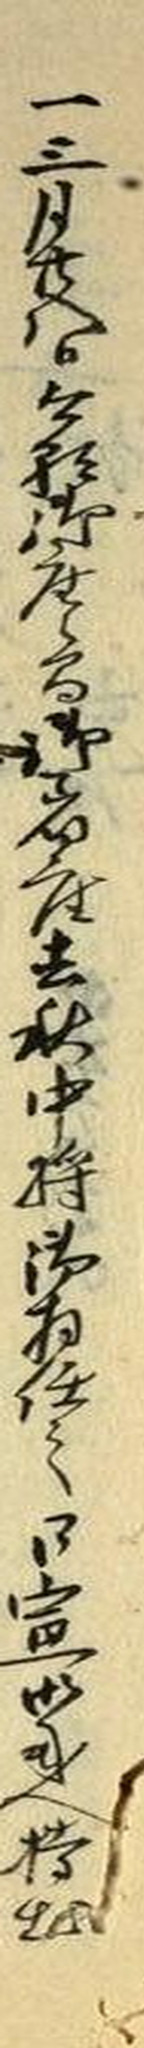一三月廿八日今朝御座之間御着座去秋中将御拝任之御宣御用人持出
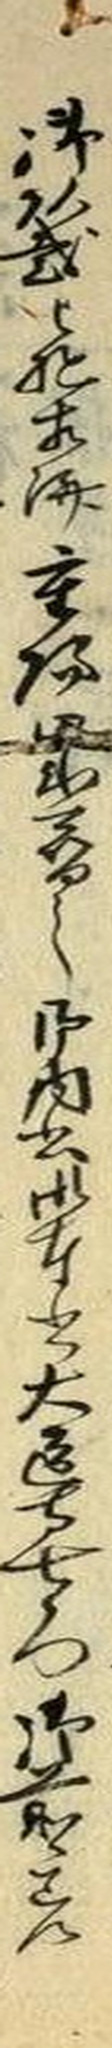御頂戴被遊相済重陽歳暮之御内書御奉書大道寺七右衛門御前差
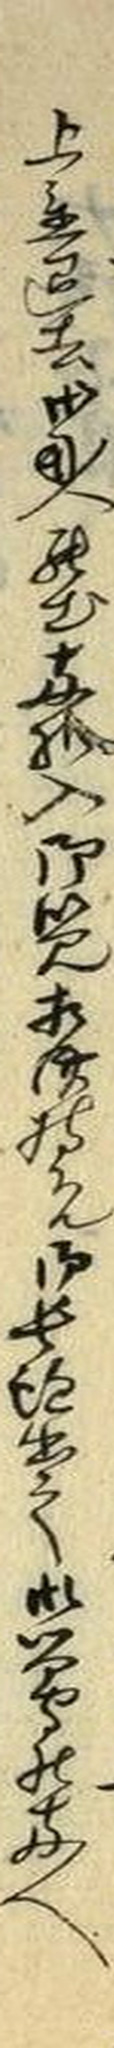上置退去御用人罷出両様入御覧相済持下ル御長鮑出之御留守居両人
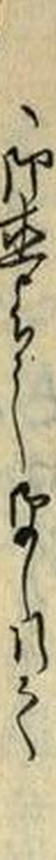へ御直被下之御のし引之
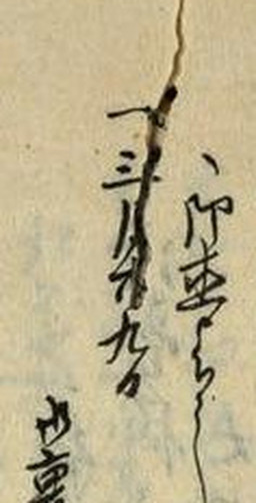一三月廿九日
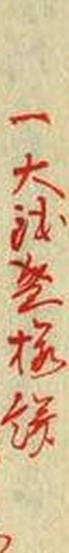一大御鉢盛桜餅
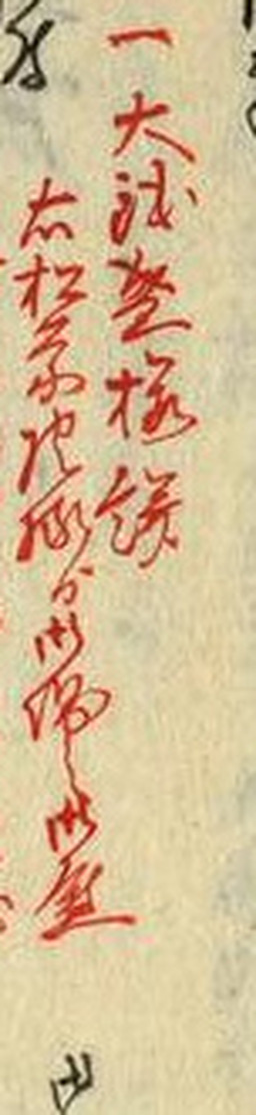右松栄院様ゟ御側之御慰
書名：少傅日録抄（斉善付側向頭取日記、江戸并道中、初入在国、逝去後…
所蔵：福井県文書館 Fukui Prefectural Archives
